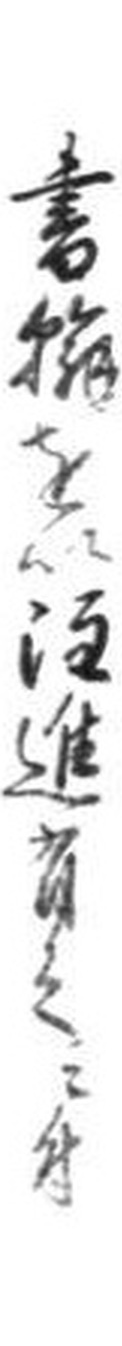書翰を以注進有之ニ付
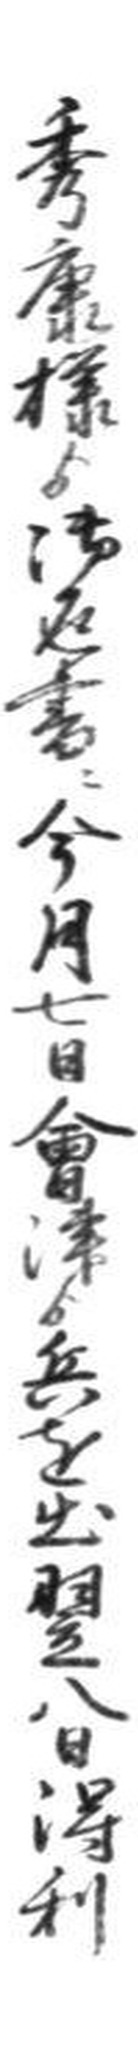秀康様ゟ御返書ニ今月七日会津ゟ兵を出翌八日得利
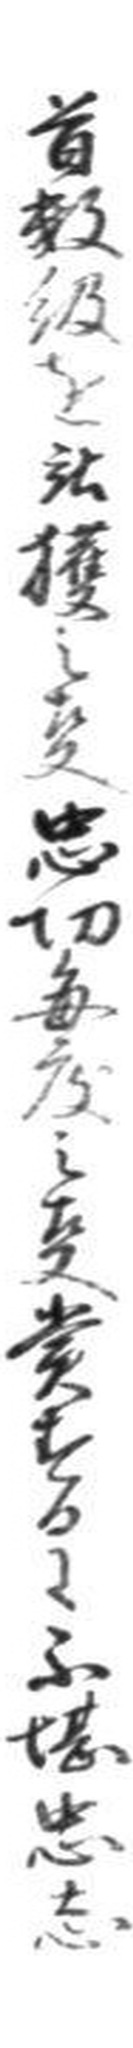首数級を被獲之事忠功毎度之事賞するに不堪忠志
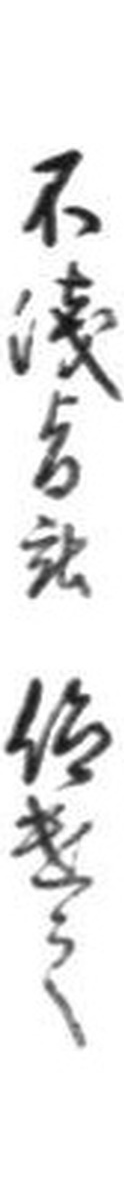不浅旨被仰遣之
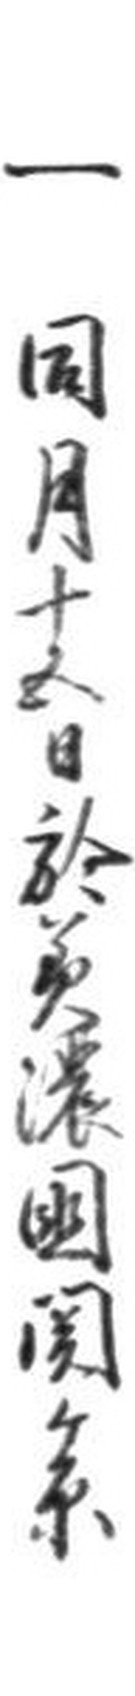一同月十五日於美濃国関ヶ原
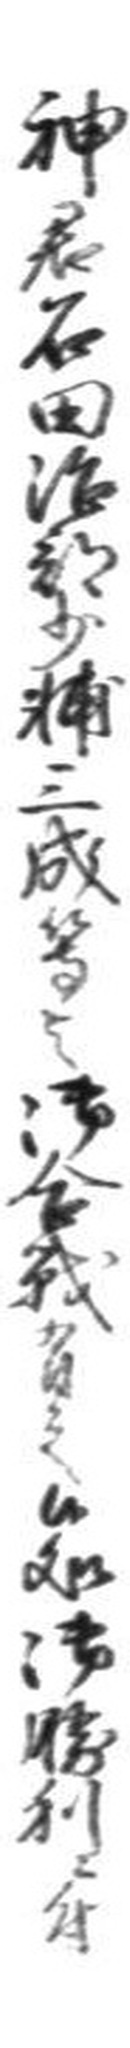神君石田治部少輔三成等と御合戦有之候処御勝利ニ付
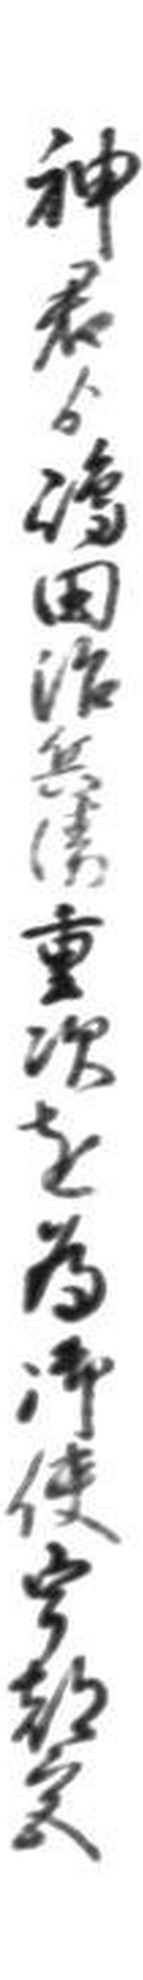神君ゟ嶋田治兵衛重次を為御使宇都宮
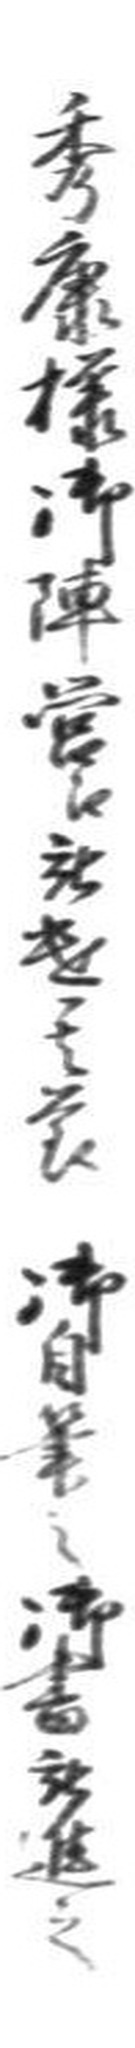秀康様御陣営江被遣其節御自筆之御書被進之
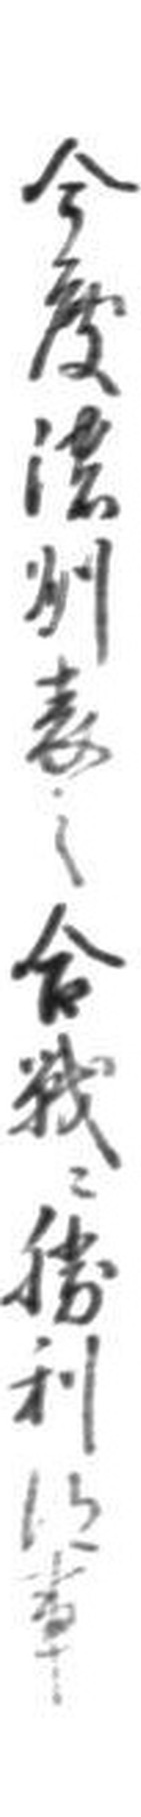今度濃州表之合戦ニ勝利得事
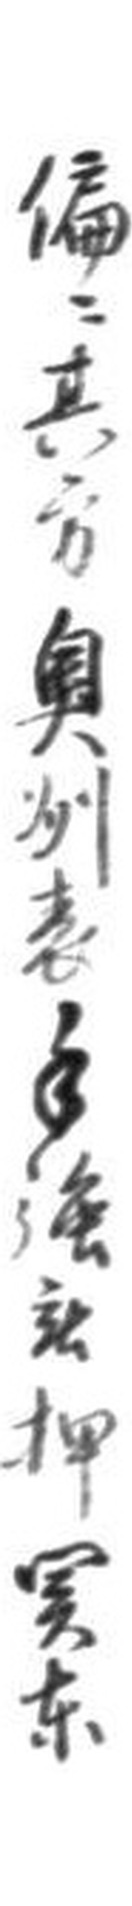偏ニ其方奥州表手強被押関東
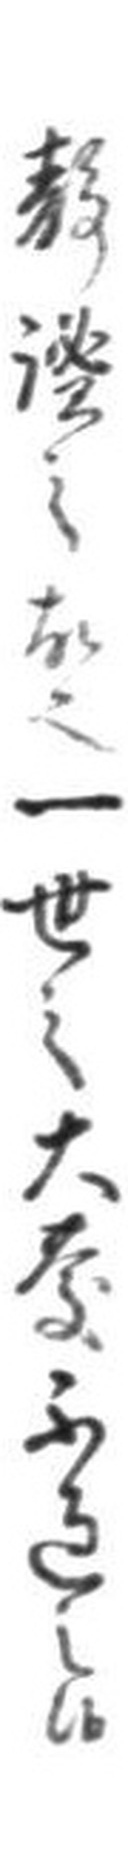静謐之故也一世之大慶不過之候
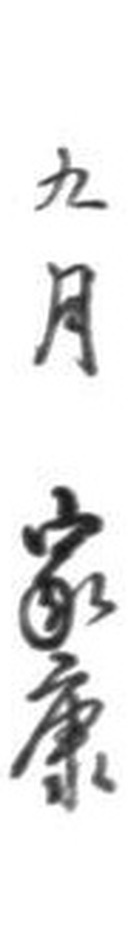九月家康

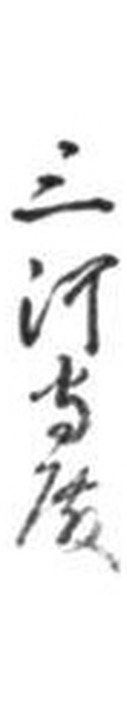三河守殿
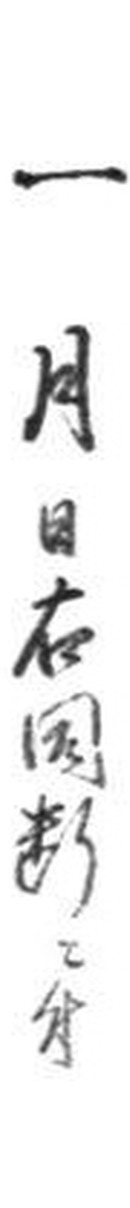一月日右同断二付
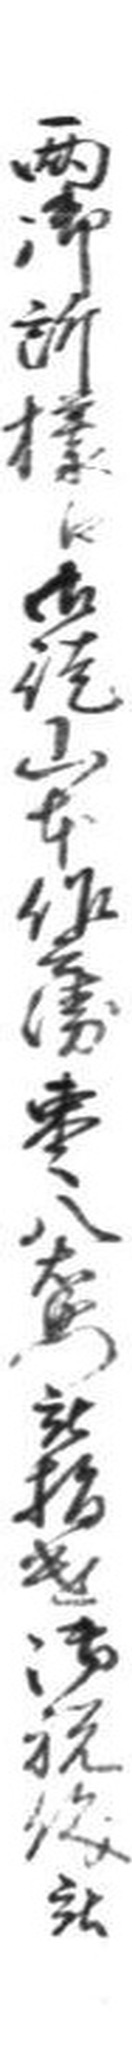両御所様江御徒山本作兵衛棗八右衛門被指遣御祝儀被
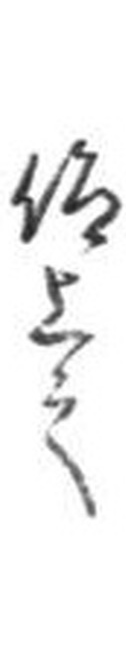仰上之
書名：家譜 一 秀康公 従天正二年到慶長十二年
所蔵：福井県文書館 Fukui Prefectural Archives
